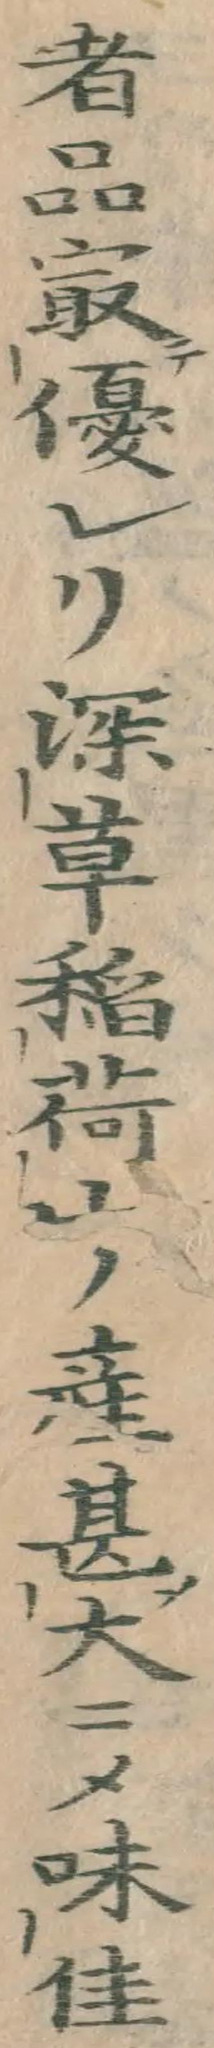者品最優レリ深草稲荷山ノ産甚大ニシテ味佳
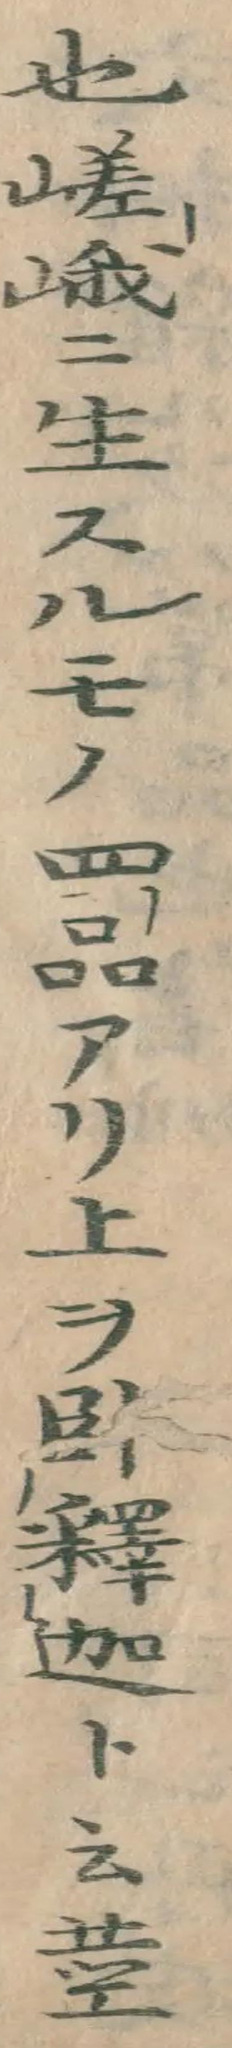也嵯峨ニ生スルモノ四品アリ上ヲ臥釈迦ト云茎
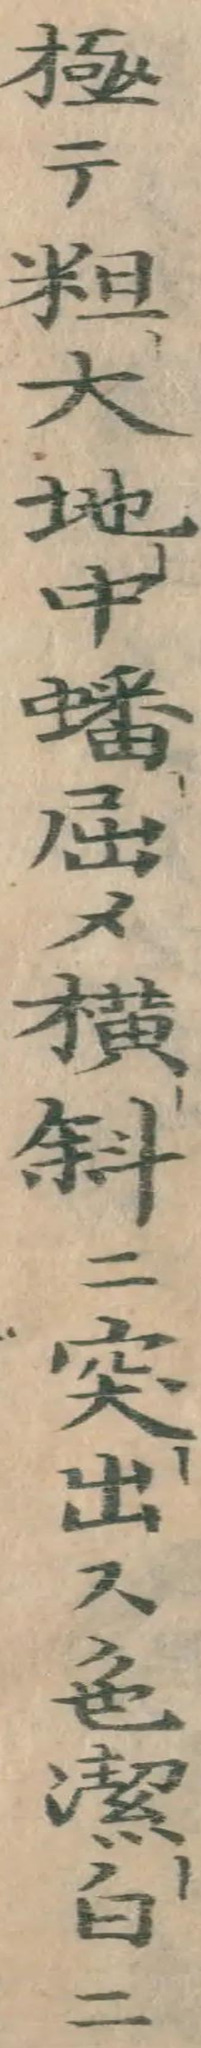極テ粗大地中蟠屈シテ横斜ニ突出ス色潔白ニ
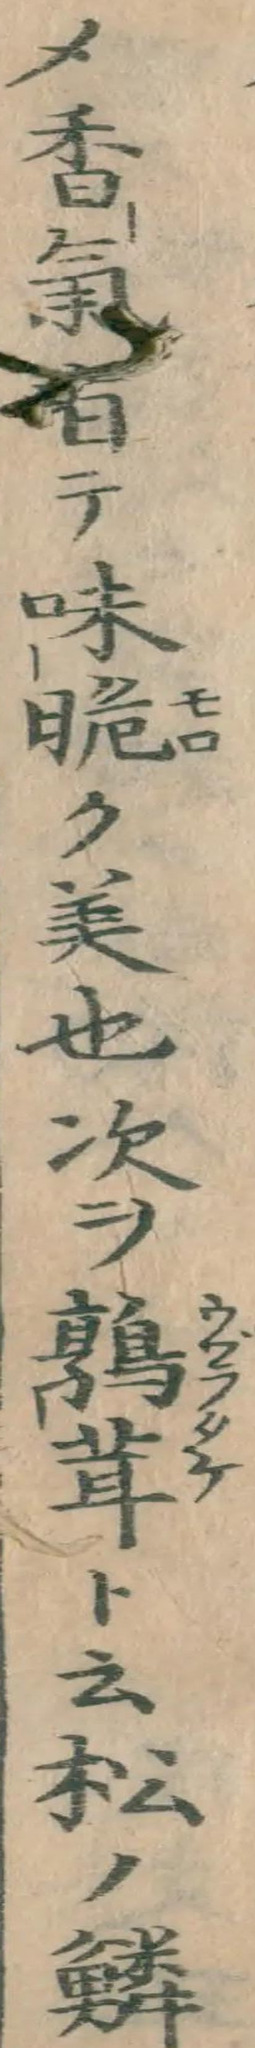シテ香気テ味脆ク美也次ヲ鶉茸ト云松ノ鱗

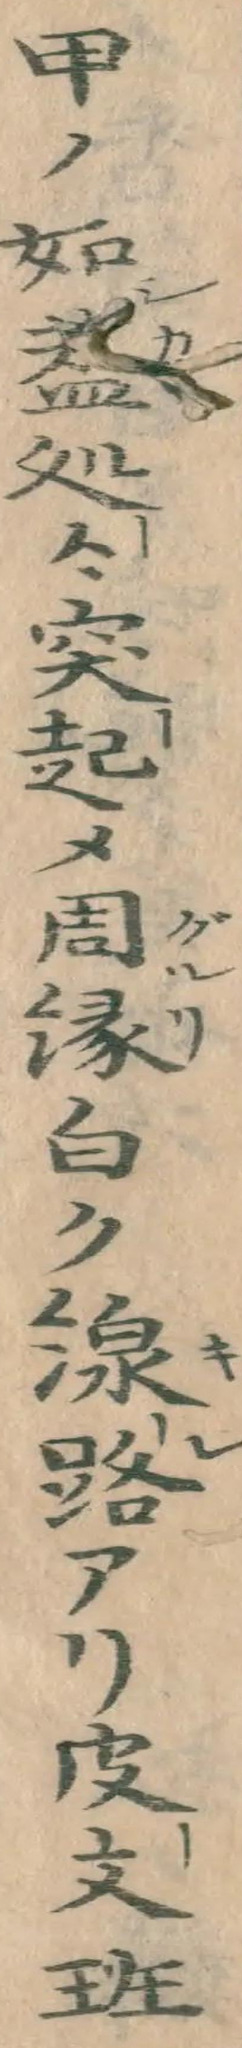甲ノ如葢処々突起シテ周縁白ク線路アリ皮文班
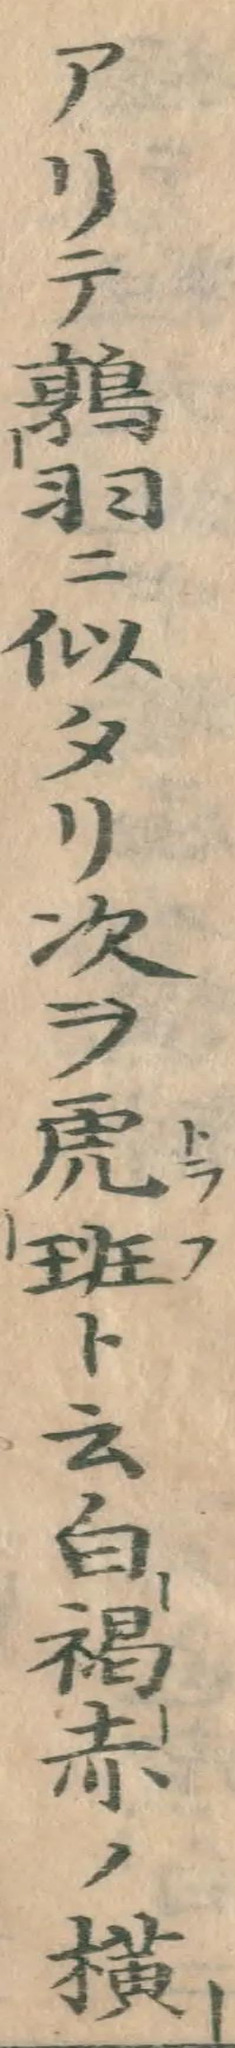アリテ鶉羽ニ似タリ次ヲ虎班ト云白褐赤ノ横
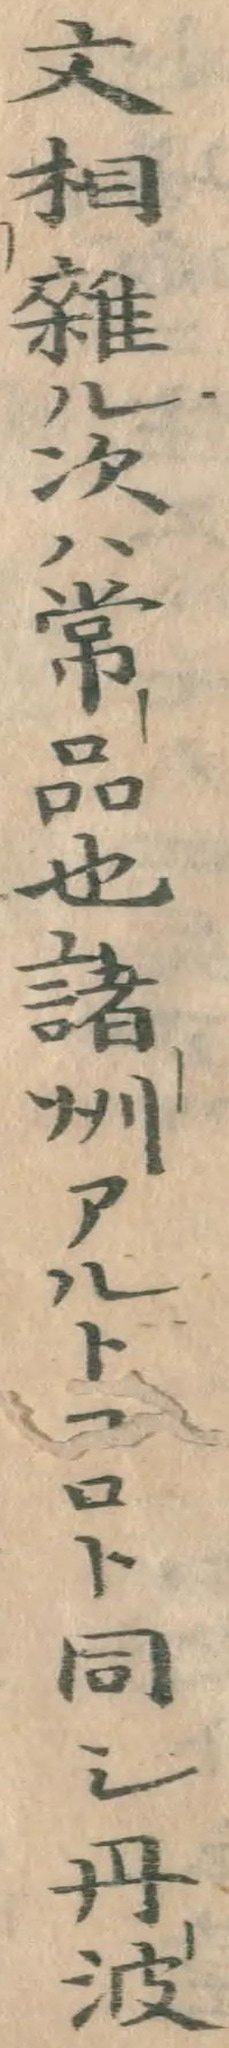文相雑ル次ハ常品也諸州アルトコロト同シ丹波
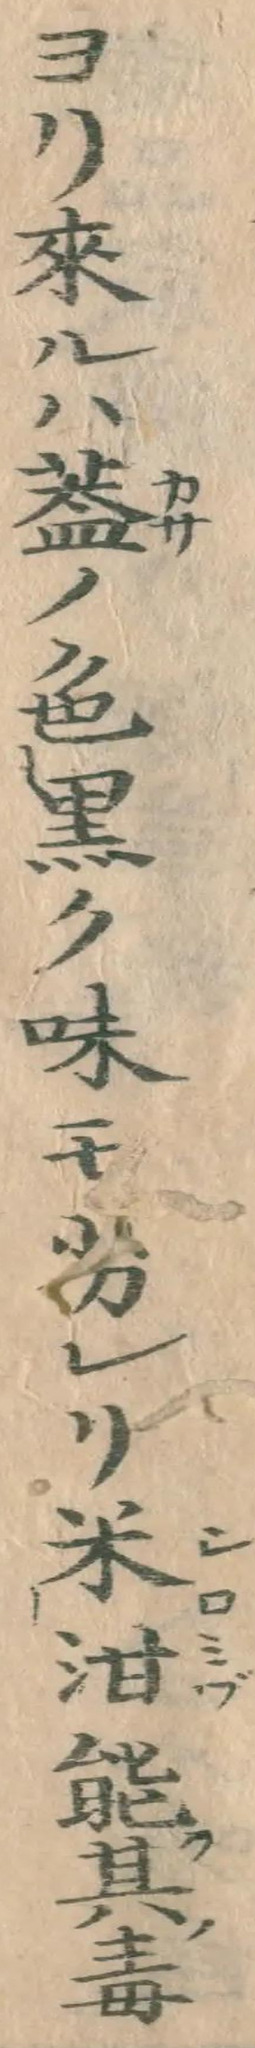ヨリ来ルハ葢ノ色黒ク味モ劣レリ米泔能其毒
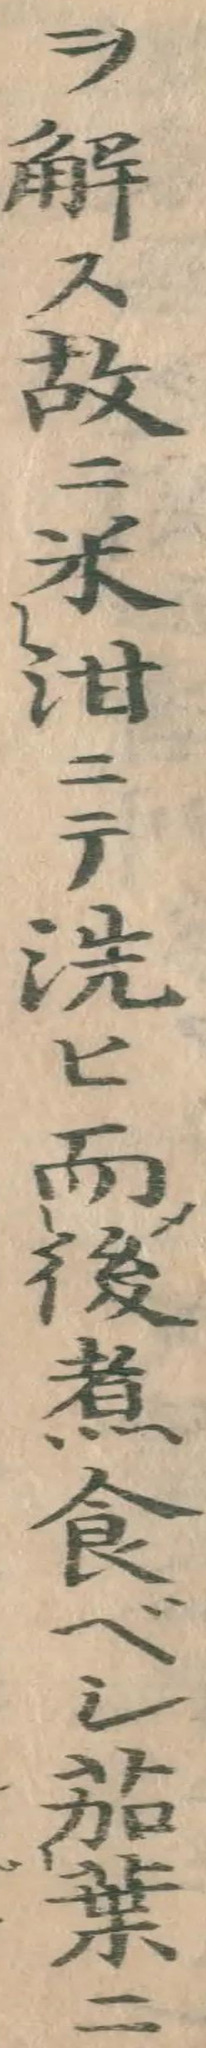ヲ解ス故ニ米泔ニテ洗ヒ而後煮食ベシ茄葉ニ
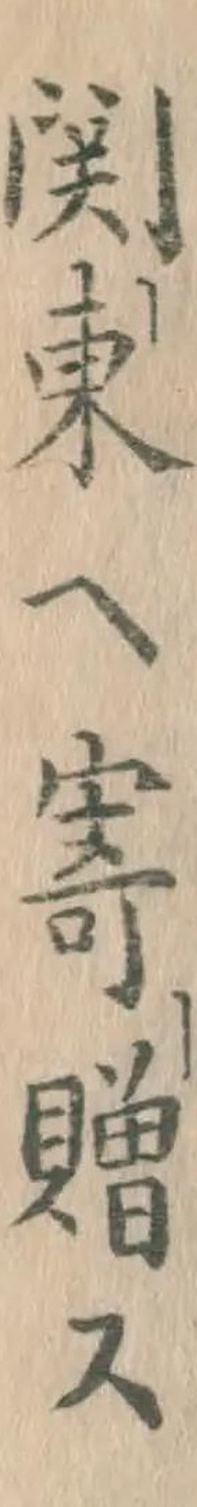関東ヘ寄贈ス
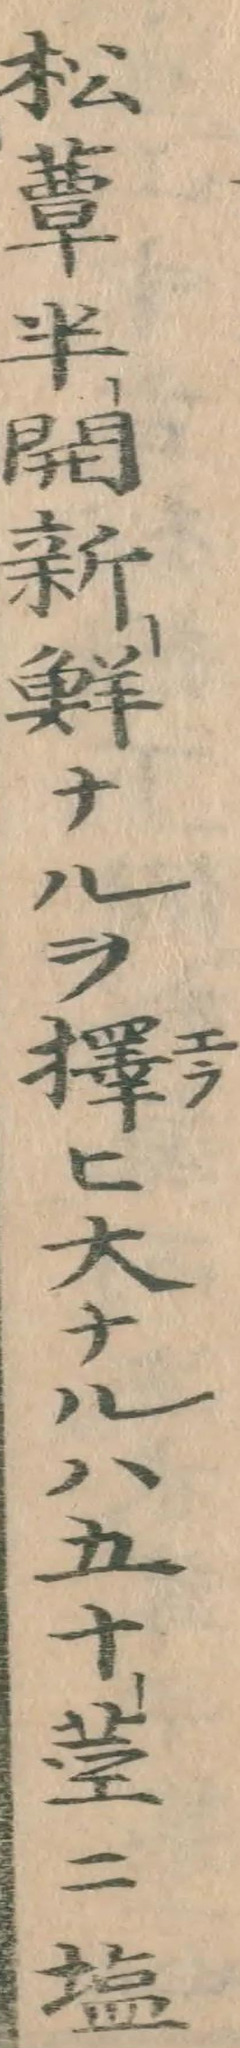松蕈半開新鮮ナルヲ択ヒ大ナルハ五十茎ニ塩
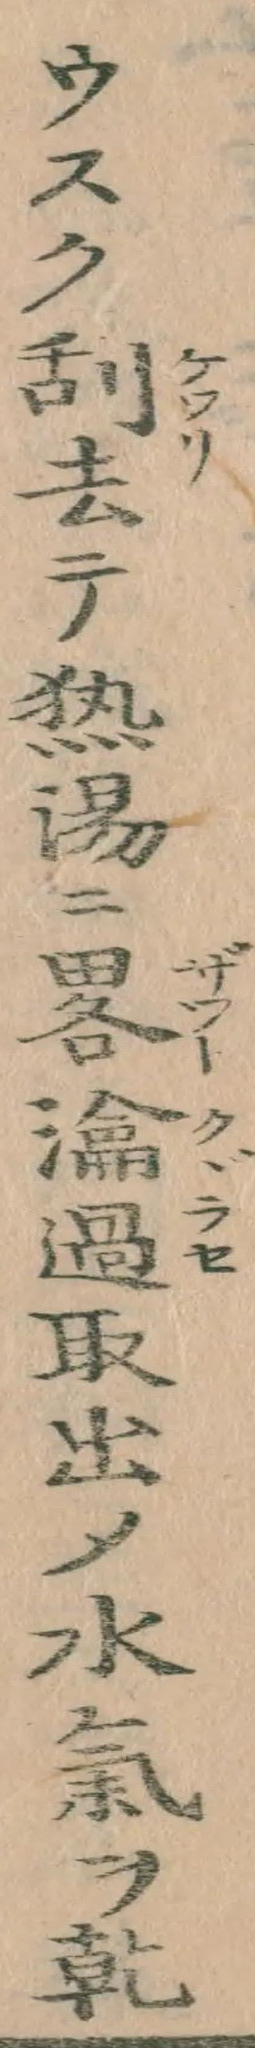ウスク刮去テ熱湯ニ略瀹過取出シテ水気ヲ乾
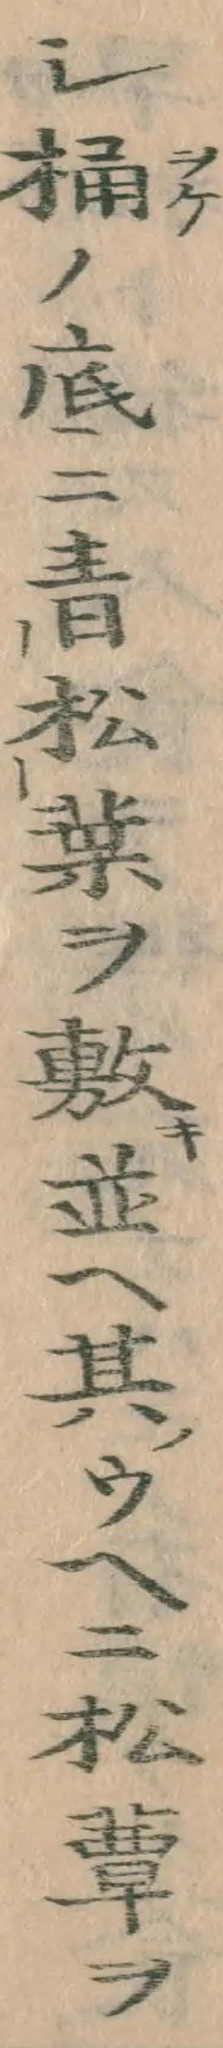シ桶ノ底ニ青松葉ヲ敷並ヘ其ウヘニ松蕈ヲ
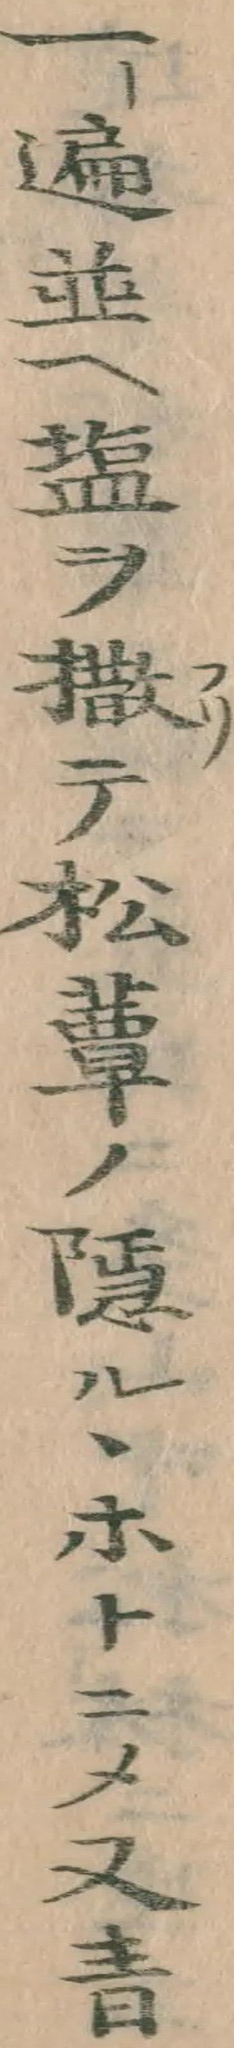一遍並ヘ塩ヲ撒テ松蕈ノ隠ルヽホトニシテ又青
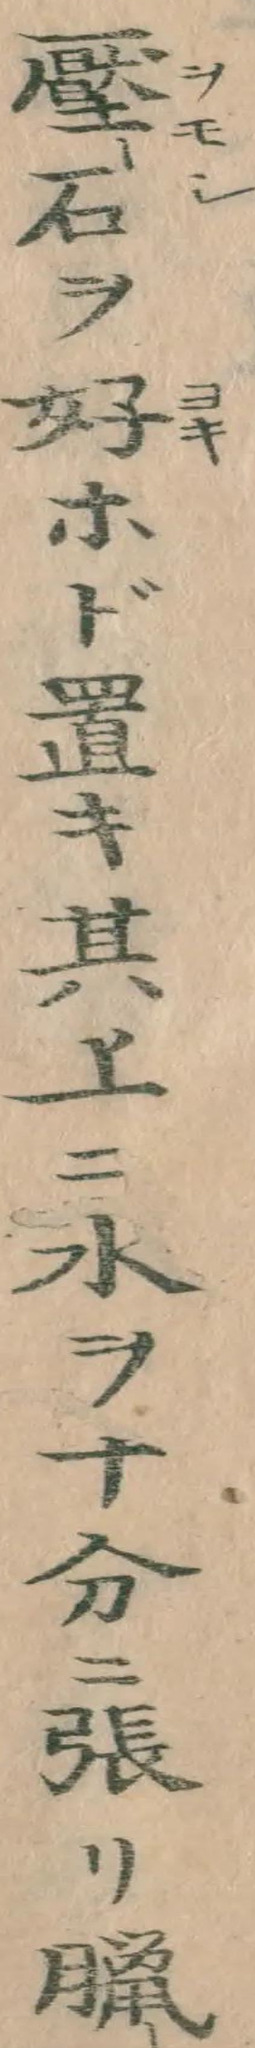壓石ヲ好ホド置キ其上ニ水ヲ十分ニ張リ臘
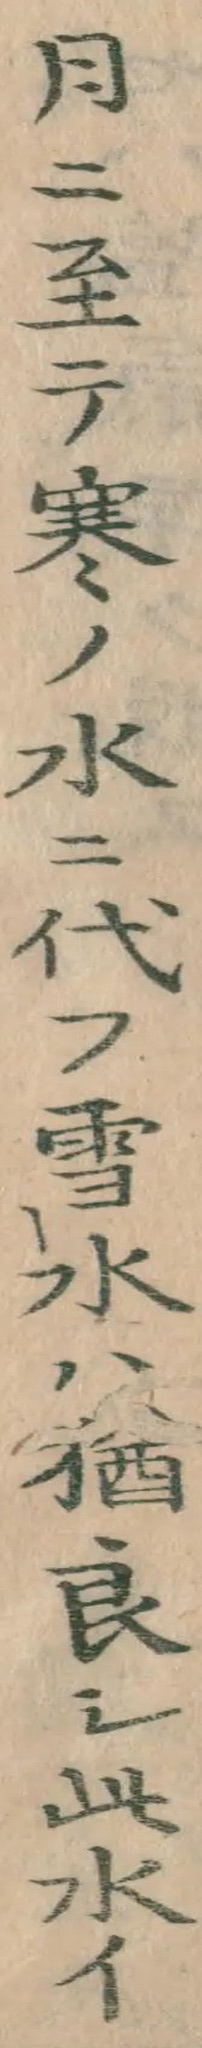月ニ至テ寒ノ水ニ代フ雪水ハ猶良シ此水イ
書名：怡顔斎菌品 2巻
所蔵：国立国会図書館 National Diet Library, JAPAN
